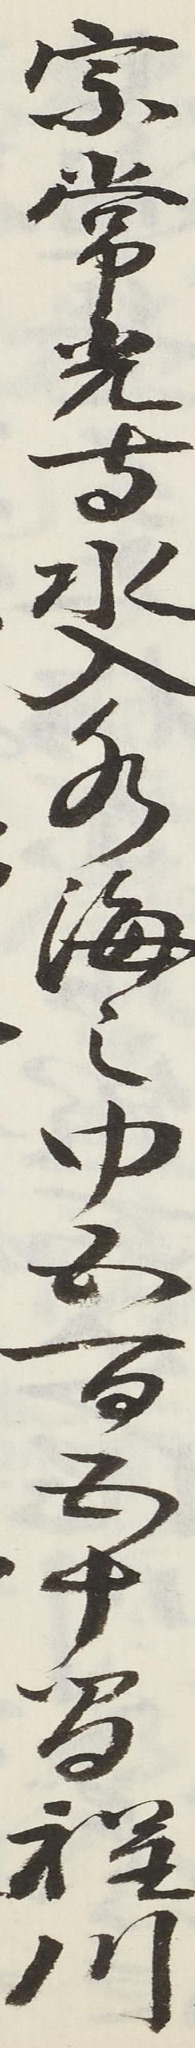宗常光寺水入海之巾五百五十間程川
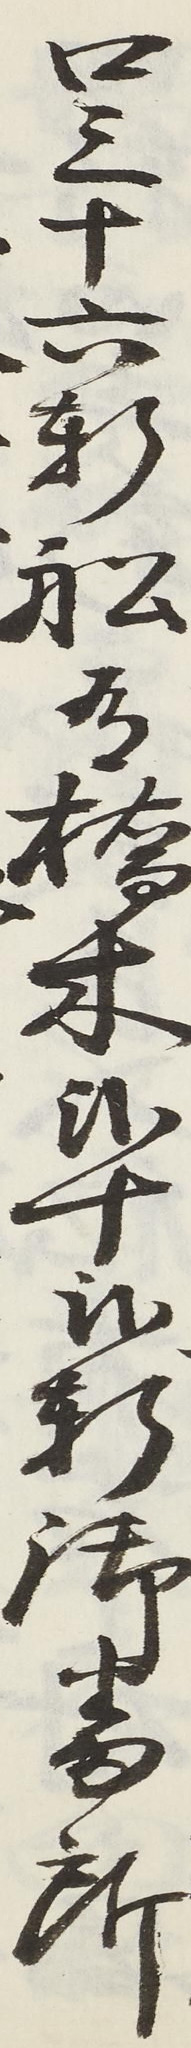口三十六軒船有橋木弐十弐軒御番所
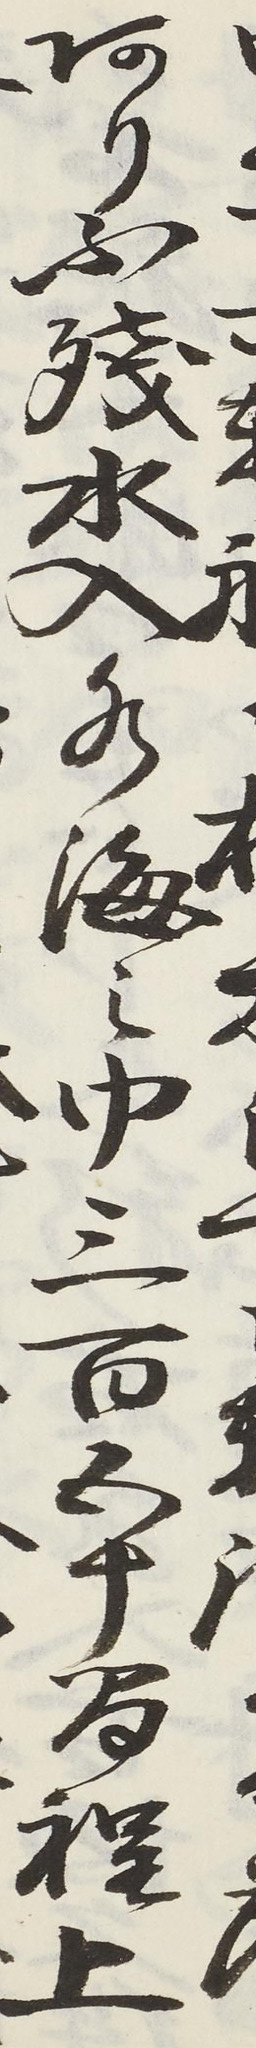あり不残水入水海之巾三百五十間程上
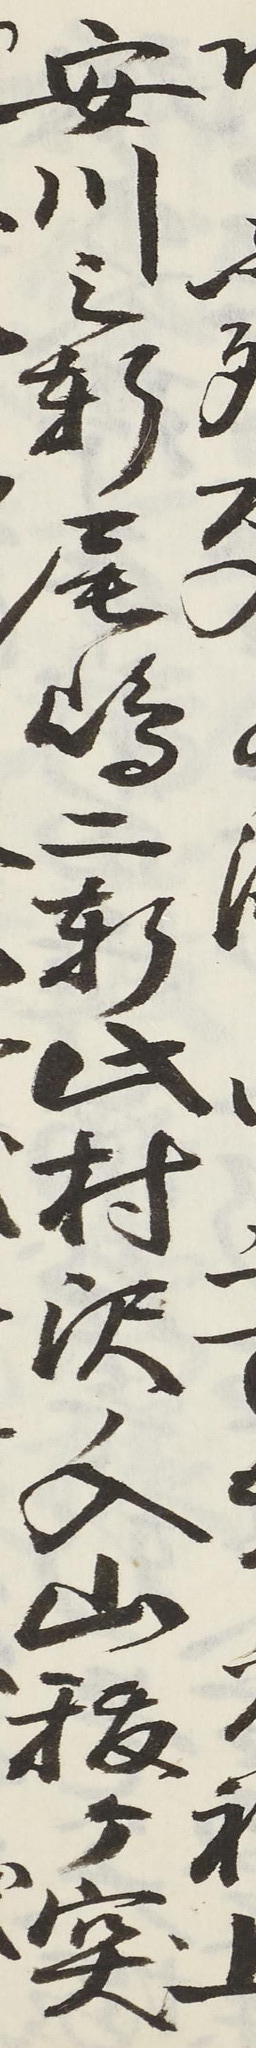安川三軒尾崎二軒此村沢ノ入山抜ヶ突
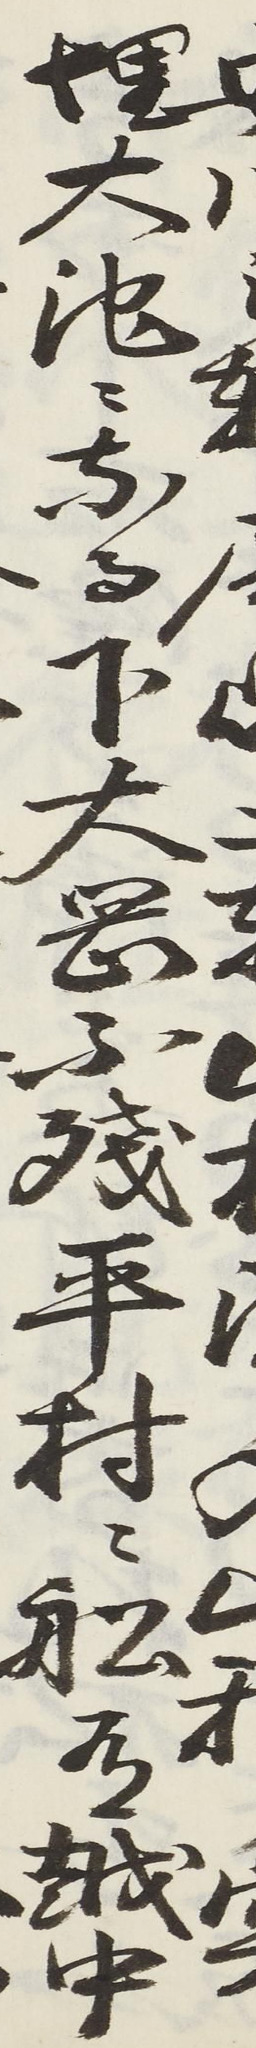埋大池二なる下大岡不残平村二船有越中
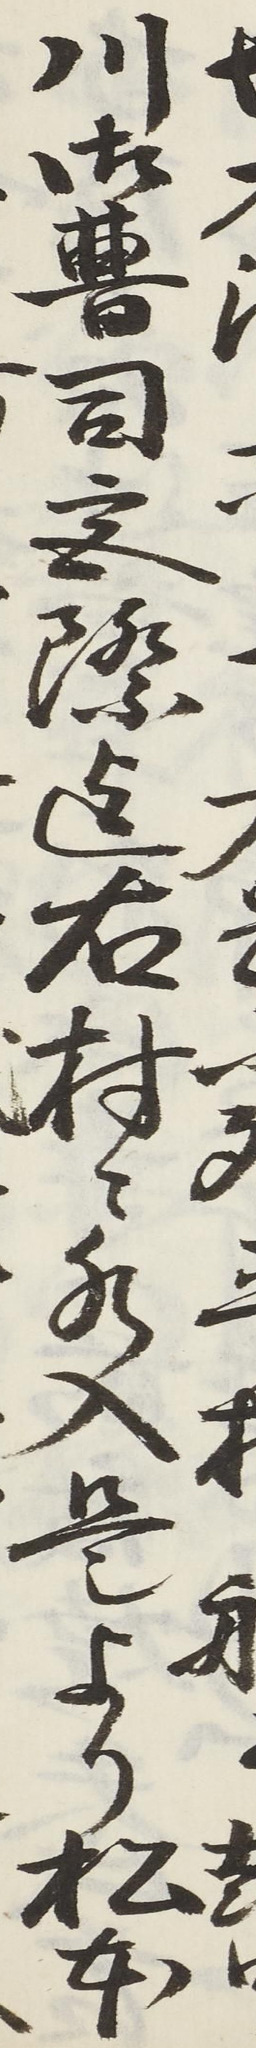川御曹司宮際迄右村々水入是より松本
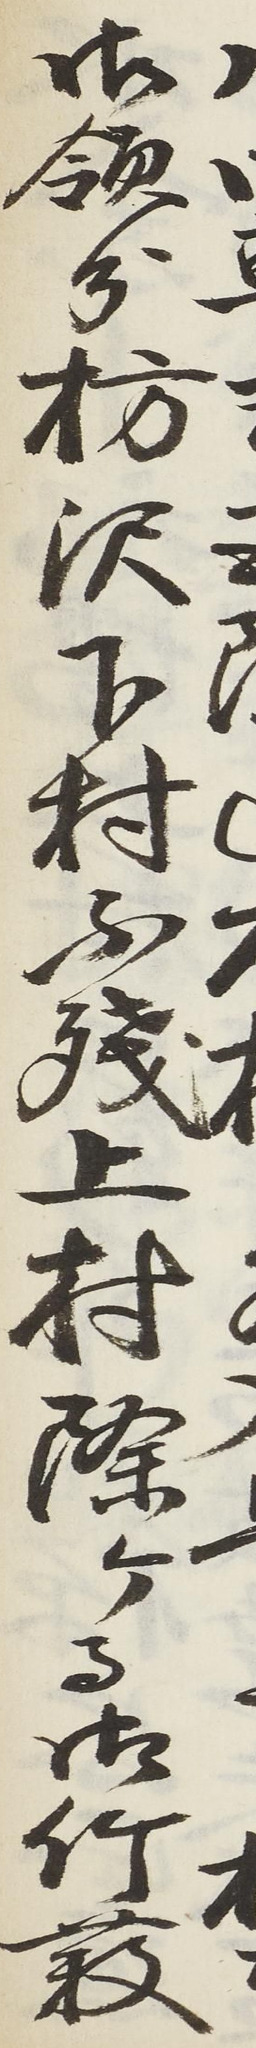御領分枋沢下村不残上村除ヶる御竹藪

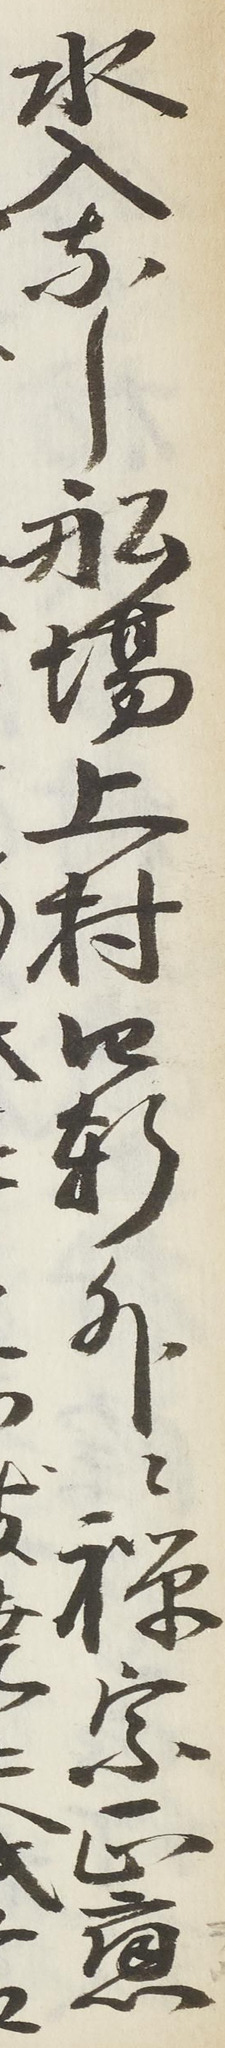水入なし船場上村四軒外二禅宗正応
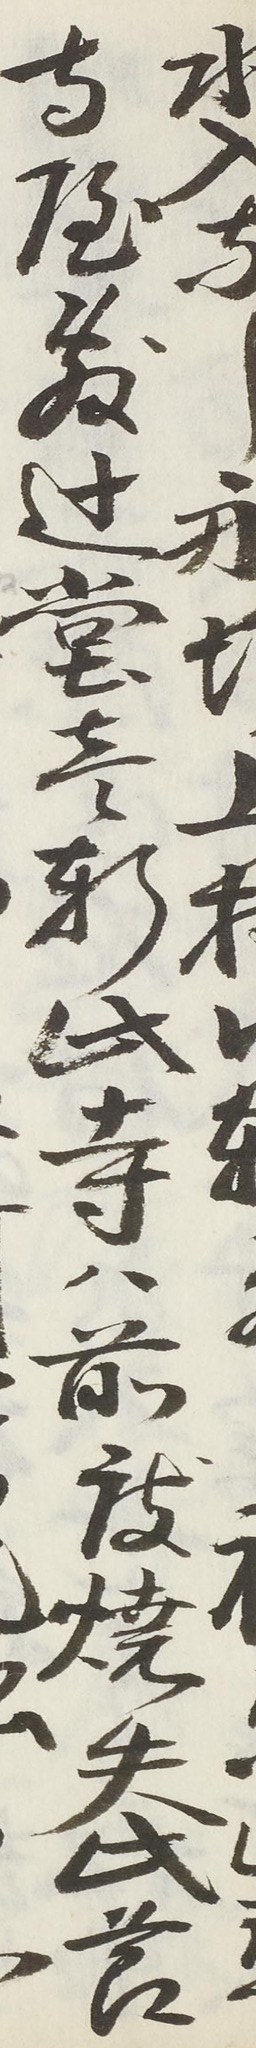寺屋敷辻堂壱軒此寺ハ前致焼失此節
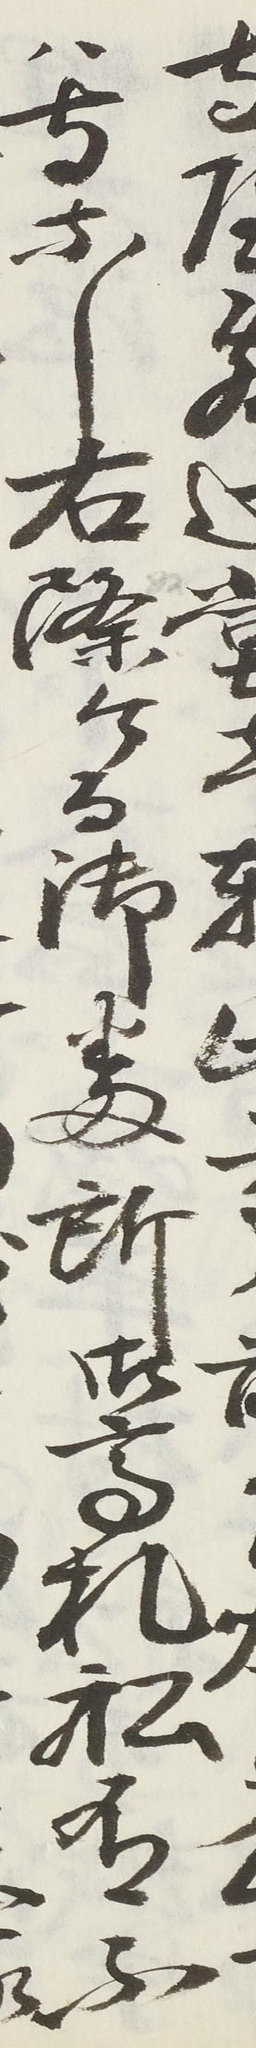ハ寺なし右除ケル御番所御高札船有不
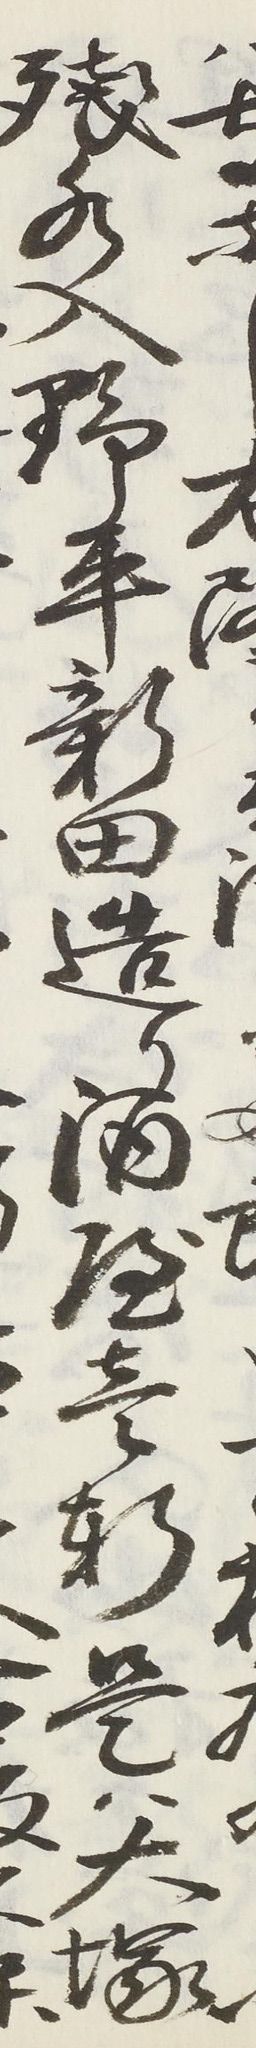残水入野平新田造り酒屋壱軒是ハ大塚
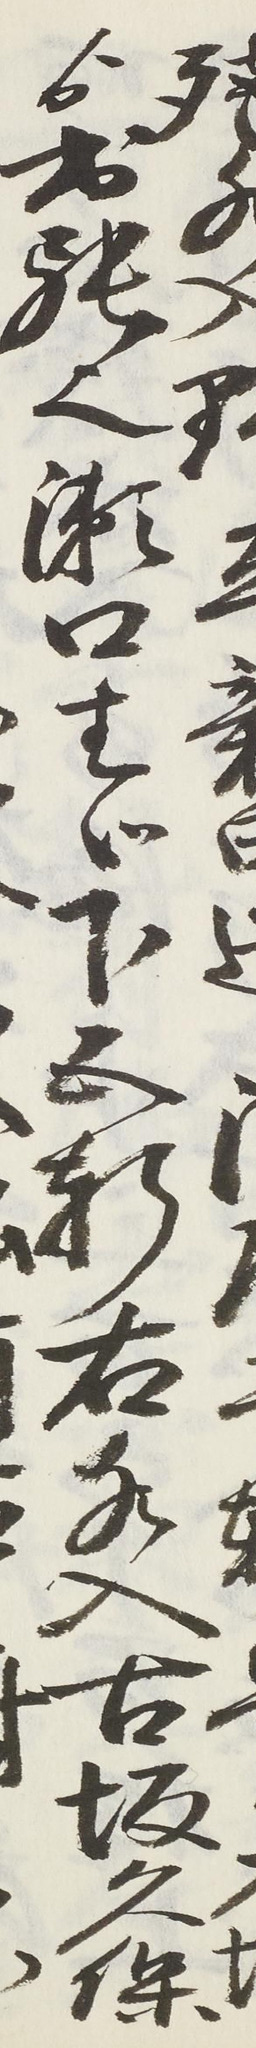ゟ出張也瀬口はゞ下五軒右水入古坂久保
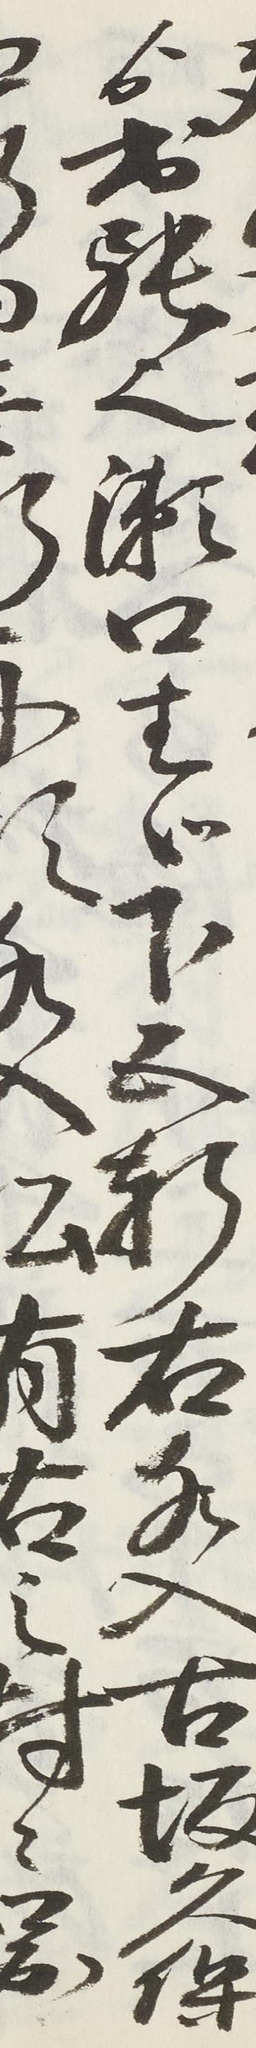ゟ出張也瀬口はゞ下五軒右水入古坂久保
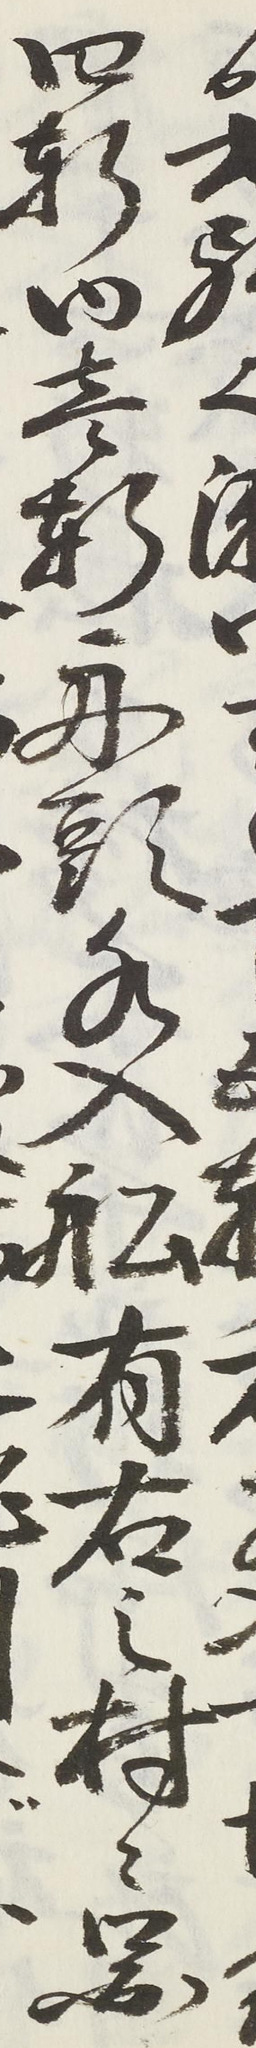四軒内壱軒舟頭水入船有右之村々図
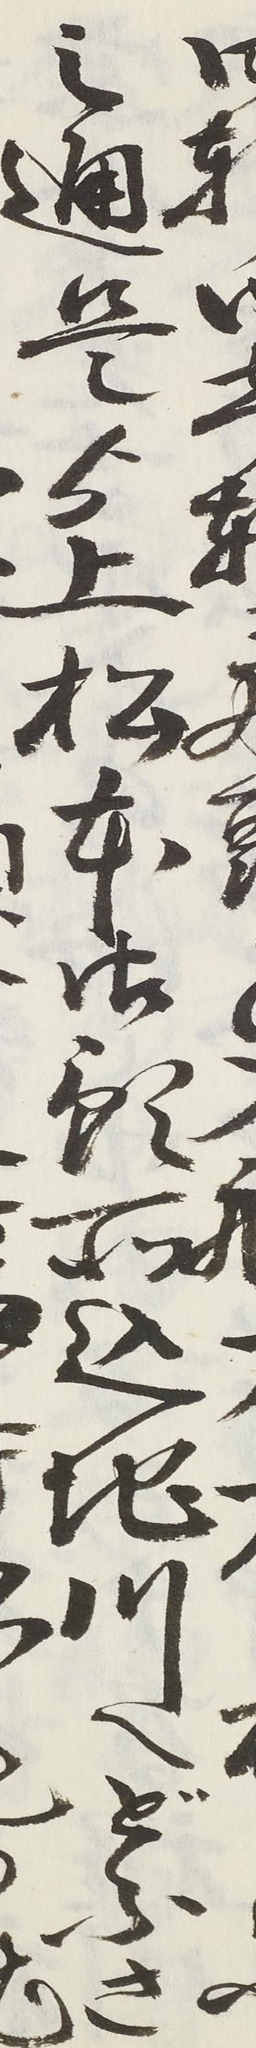之通是ゟ上松本御領所込地川へどふさ
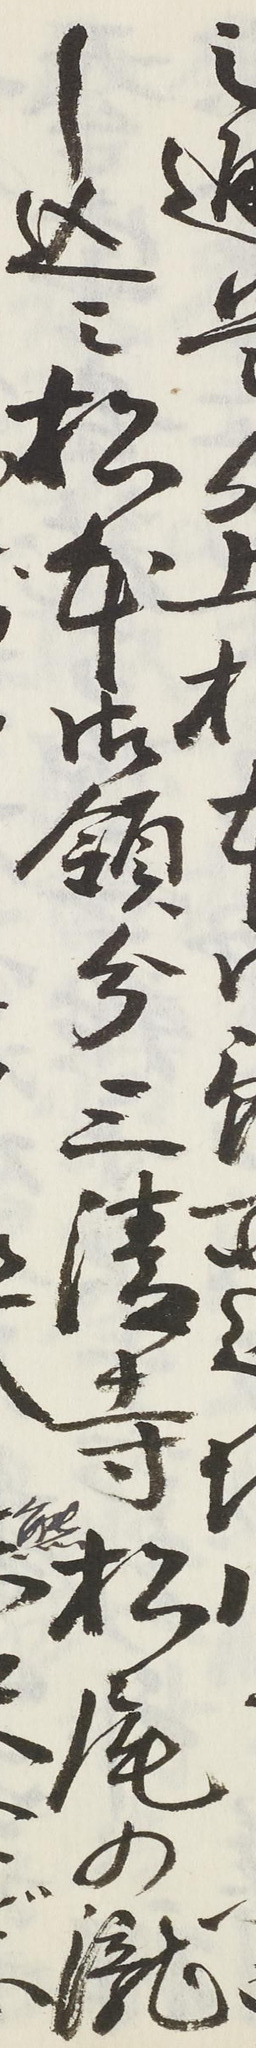し込二松本御領分三清寺松尾の瀧
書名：弘化四年地震記
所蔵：東京大学地震研究所図書室 Earthquake Research Institute Library, The University of Tokyo, JAPAN
